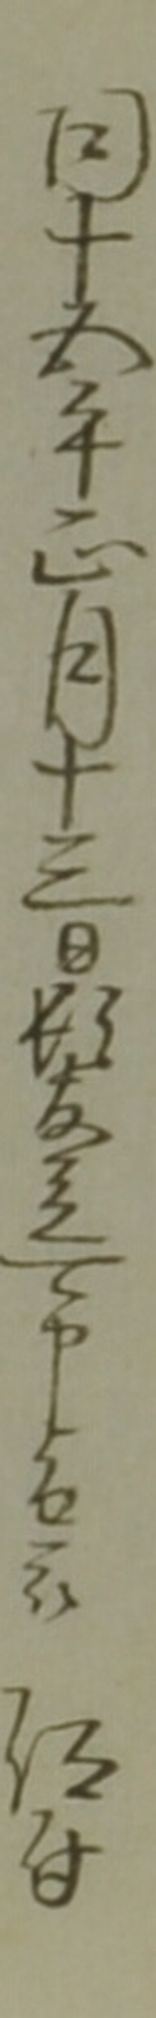一同十五午正月十三日髪立可申旨被仰付
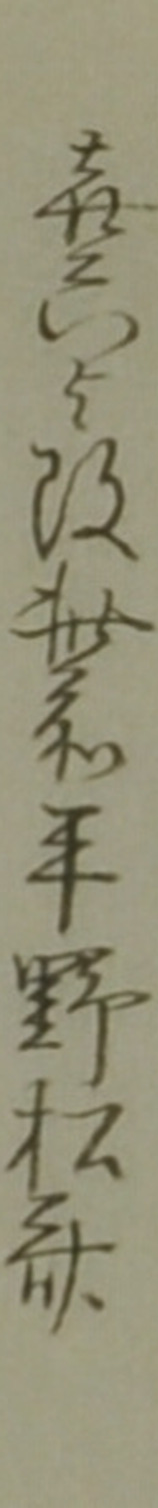喜六与改此前平野松斉
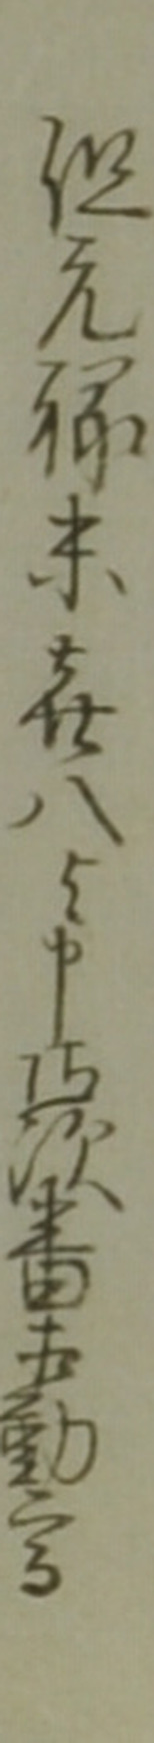但元禄末喜八与申御次番相勤高
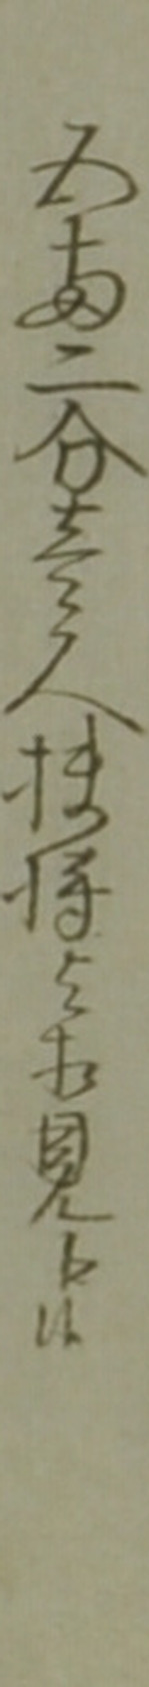五両二分壱人扶持与相見江候
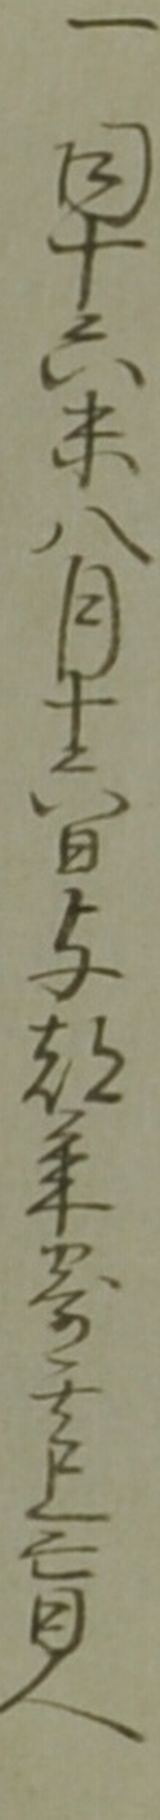一同十六未八月十六日与都年寄其上盲人
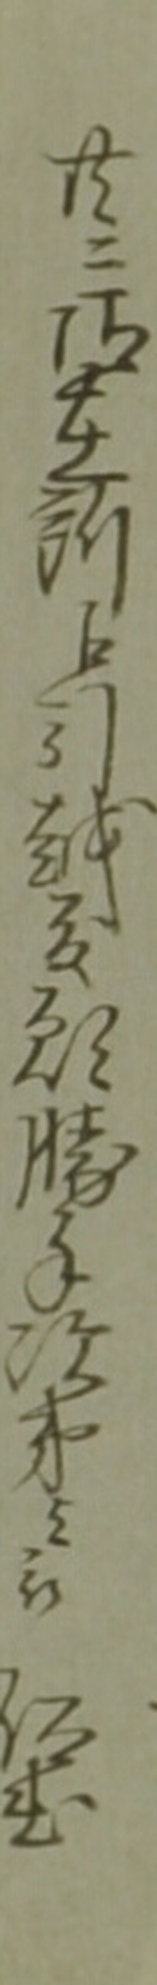共ニ御在所江引越度願勝手次第与被仰出
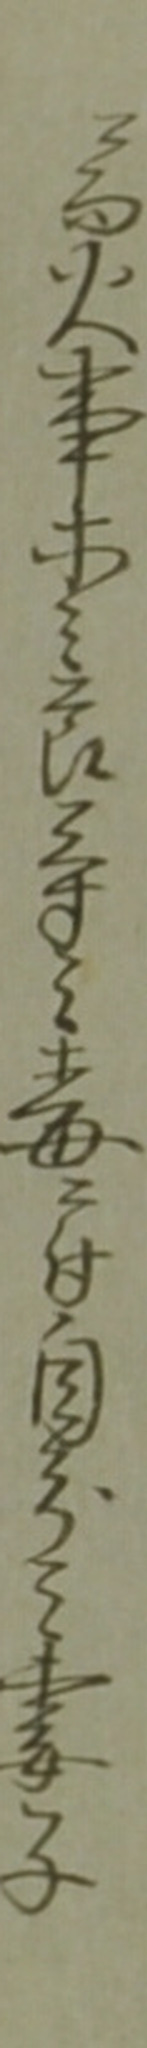ニ而火事等之節気之毒ニ付自分之妻子
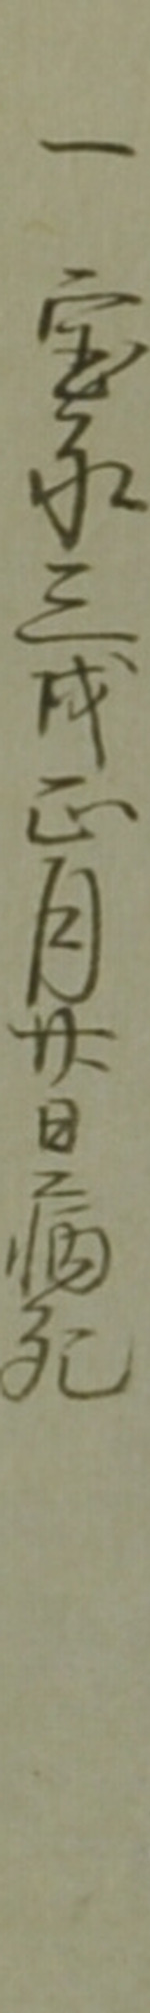一宝永三戌正月廿日病死
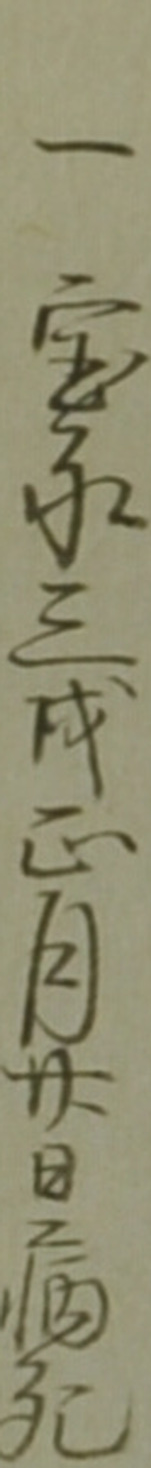一宝永三戌正月廿日病死
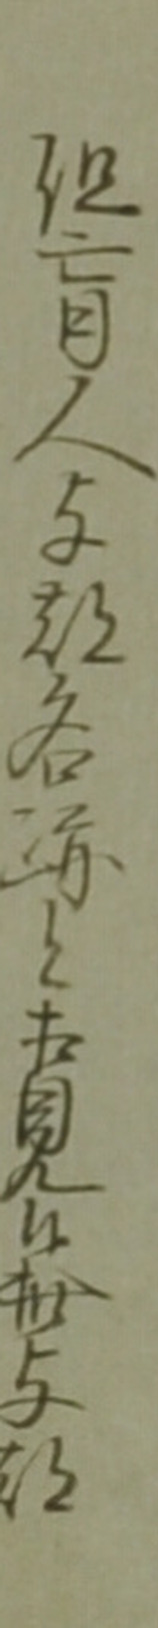但盲人与都名跡之相見候此与都
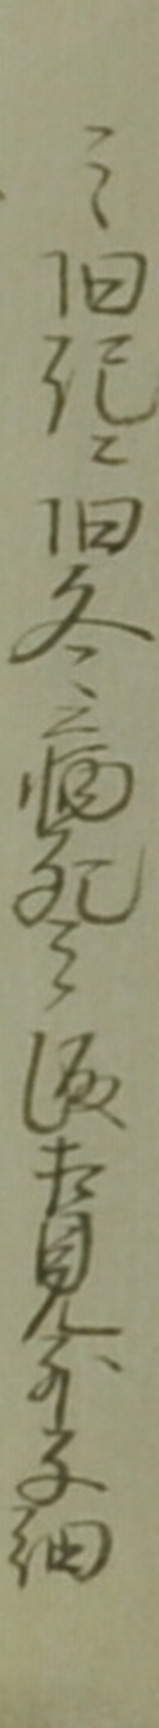之旧記ニ旧冬病死之趣相見外子細
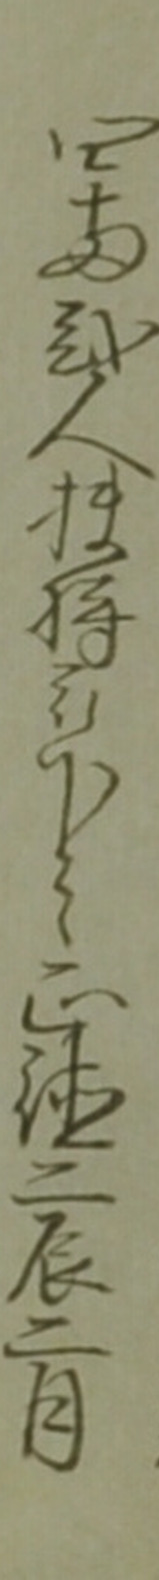四両弐人扶持被下之正徳二辰二月

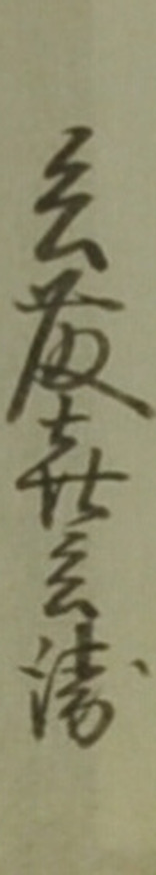兵藤喜兵衛
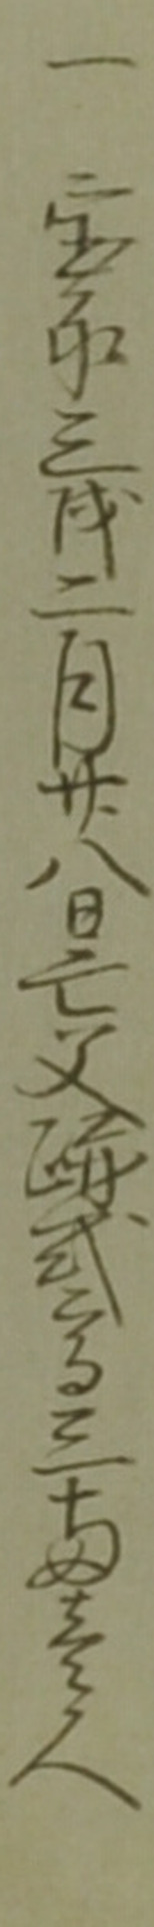一宝永三戌二月廿八日亡父跡式高三両壱人
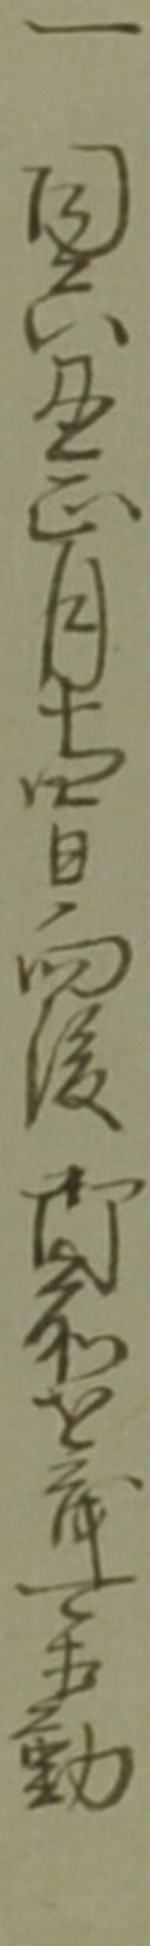一同六丑正月十四日向後御前を茂可相勤
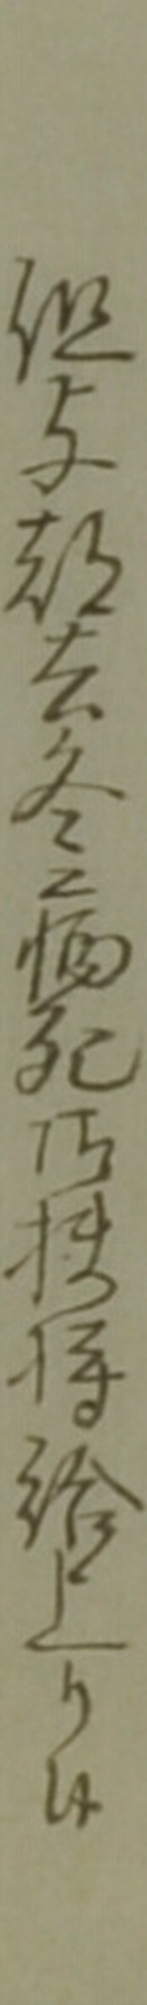但与都去冬病死御扶持給上り候
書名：無足諸士勤仕録（九）
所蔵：伊那市立高遠町図書館・合同会社AMANE
